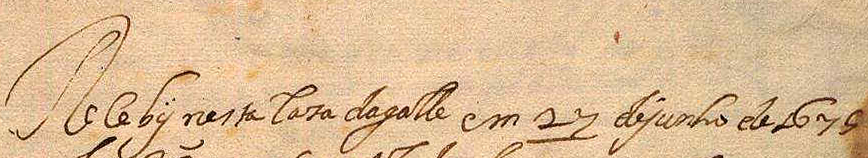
Receby nesta Caza da galle em 27 de junho de 1675
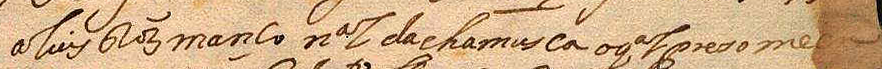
a Luis Roz̄ manço n.al da chamusca o qal prezo me en
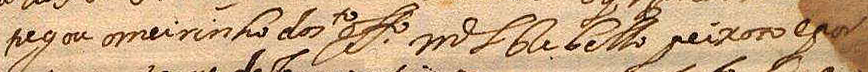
tregou o meirinho do sto off.o mel Rebello peixoto e por
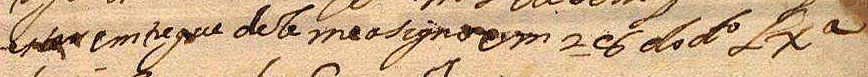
estar emtregue dele me asigno em 28 do d̄o Lxa
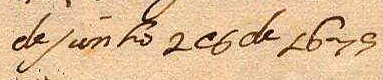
de junho 28 de 1675
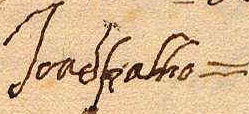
Joaõ fialho =
